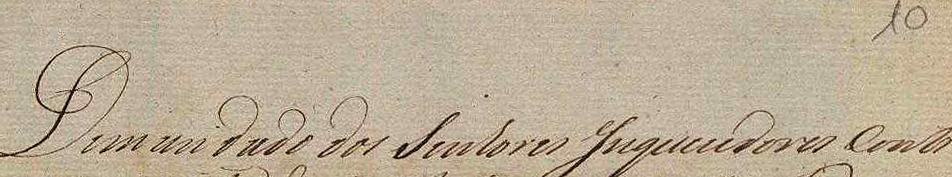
Demandado dos Senhores Inquizidores cont
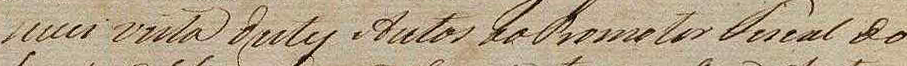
nuei vista destes Autos ao Promotor Fiscal do
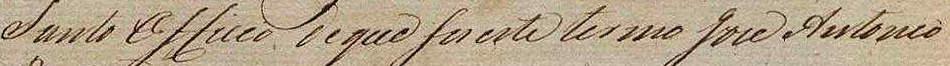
Santo Officio, de que fis este termo Joze Antonio
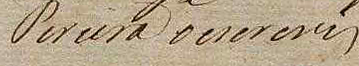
Pereira escrevi
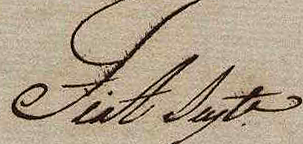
Fiat Iuste
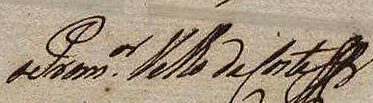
o Promo.or Velho da Costa
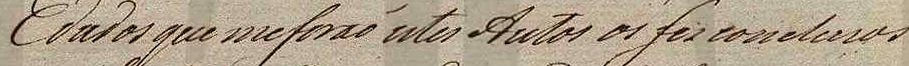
E dados que me foraõ estes Autos os fiz concluzos
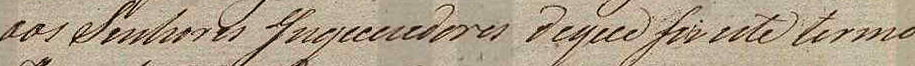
aos Senhores Inquizidores de que fiz este termo
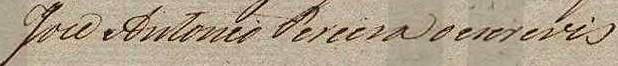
Joze Antonio Pereira o escrevi
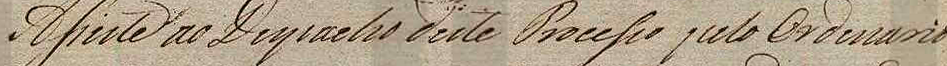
Assiste ao Despacho deste Processo pelo Ordenario
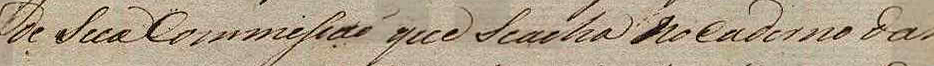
de Sua Commissaõ que Se acha no caderno das
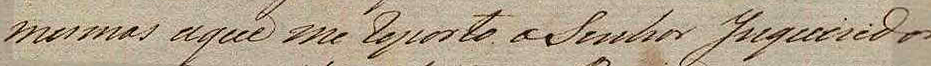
mesmas a que me Reporto o Senhor Inquizidor
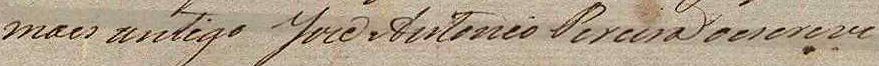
mais antigo Joze Antonio Pereira o escrevi
